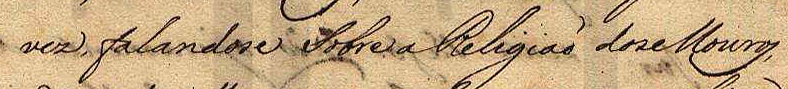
vez, falandose sobre a Religiaõ dos Mouros,
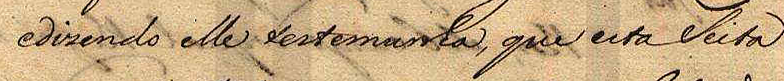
e dizendo elle testemunha, que esta Seita
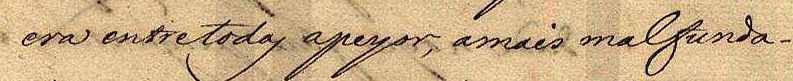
era entre todas a peyor, a mais mal funda
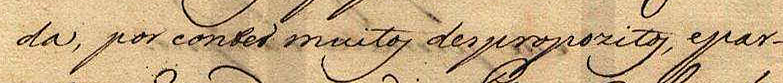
da, por conter muitos despropozitos, e par
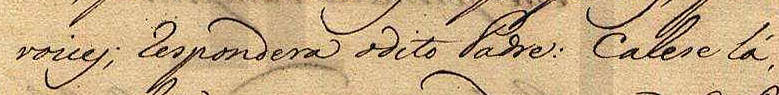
voices; Respondera o dito Padre: Calese lá,
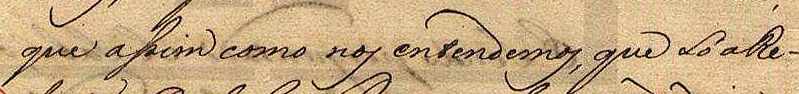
que assim como nos entendemos, que so a Re
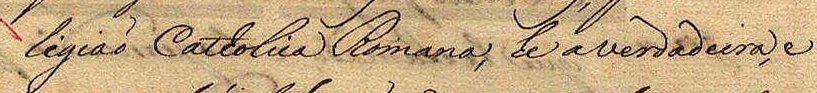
ligiaõ Catholica Romana, he a verdadeira, e
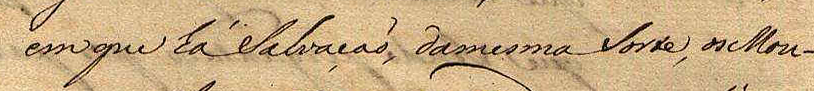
em que há Salvaçaõ, da mesma Sorte, os Mou
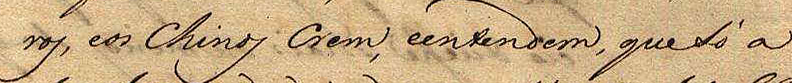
ros, e os Chinos crem, e entendem, que só a
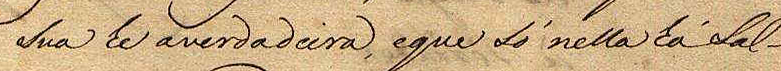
sua he a verdadeira, e que só nella há Sal
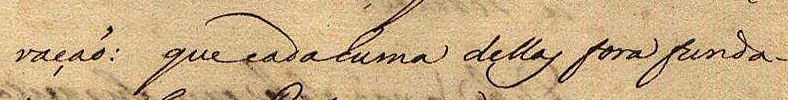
vaçaõ: que cada huma dellas fora funda
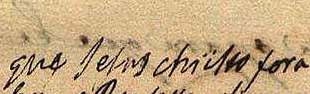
que Iesus christo fora
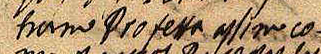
hum Profetta assim co
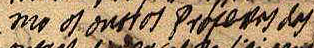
mo os outros Profetas das
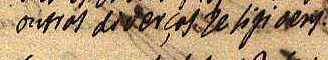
outras diverças Religioens
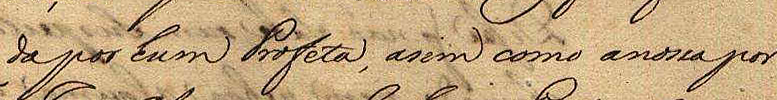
da por hum Profeta, asim como a nossa por
